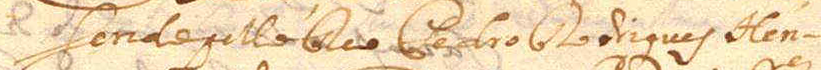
sendo pello Reo Pedro Rodrigues Hen
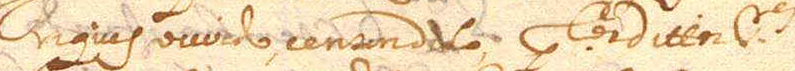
riques ouuido, e entendendo, plos dittos s.res
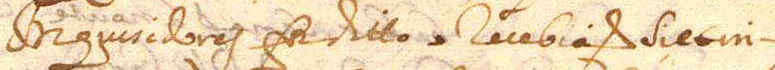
Inquisidores foi ditto o Recebiaõ si et in
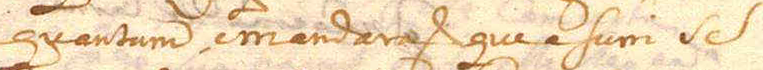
quantum, e mandaraõ que assim se
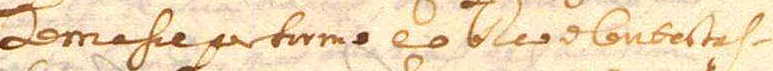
tomasse por termo e o Reo o Contestas
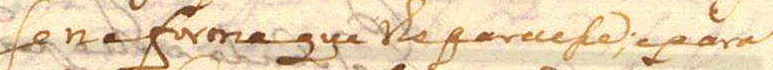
se na forma que lho parecesse; e para
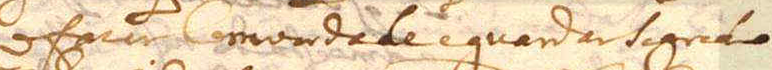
o fazer Com verdade e guardar segredo
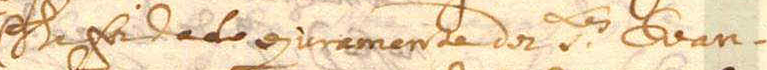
lhe foi dado o juramento dos s.tos Evan
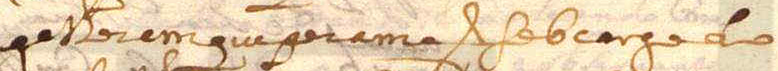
gelhos em que pos a maõ sob cargo do
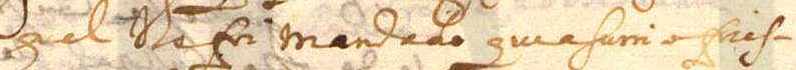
qual lhe foi mandado que assim o fizes
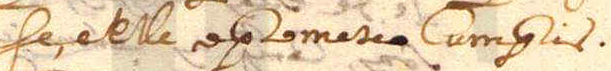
se, e elle o prometeo Cumprir.
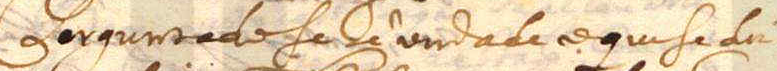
Perguntado se he verdade o que se diz
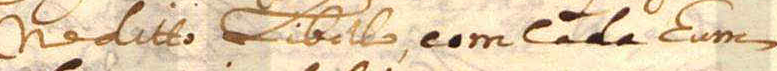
no ditto Libello, com cada hum
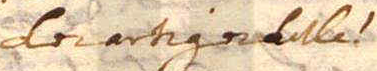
dos artigos delle?
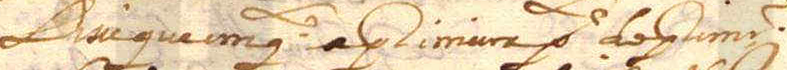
Disse que emq.to a primeira pte do primr.o
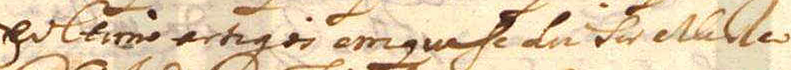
e ultimo artigos em que se diz ser elle Reo
